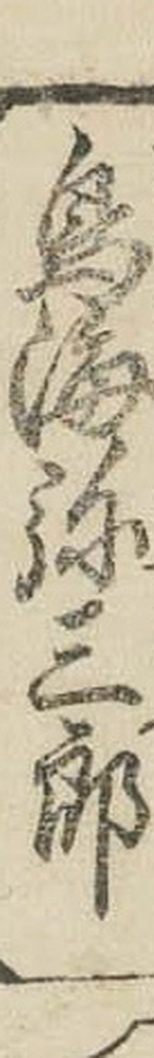鳥海弥三郎
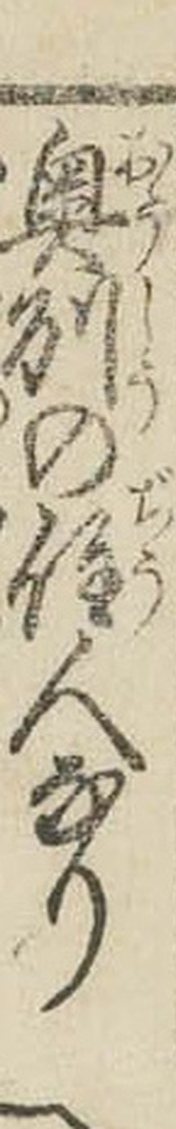奥州の住人なり
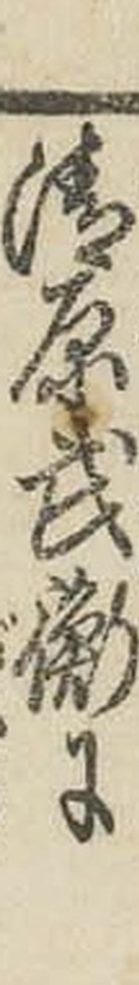清原武衡に
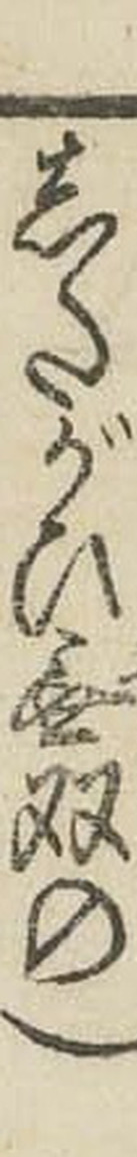したがひ無双の
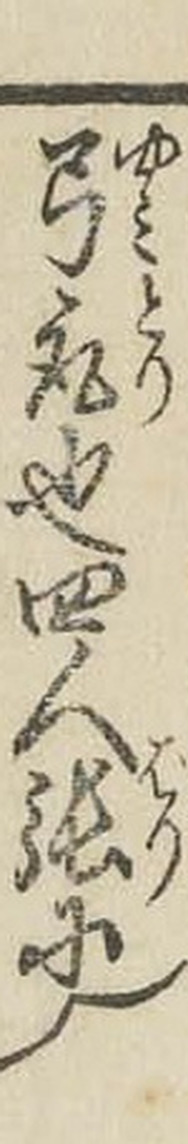弓取也四人張に
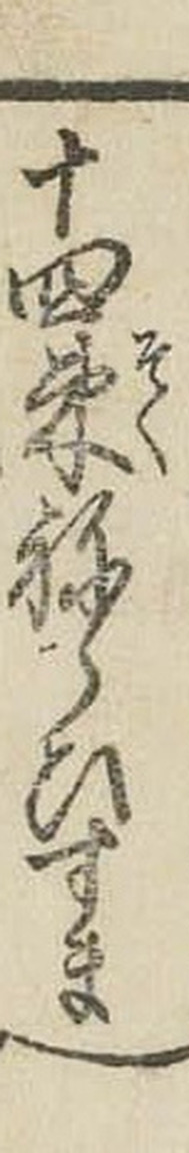十四束ねらひすま
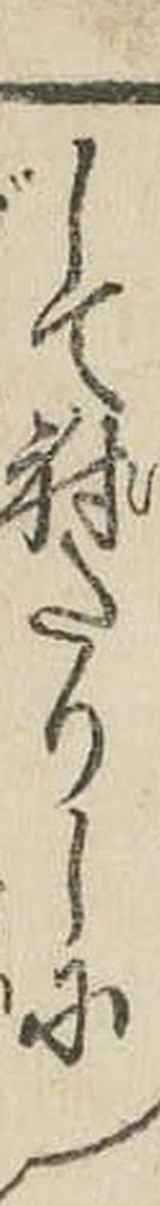して射たりしに
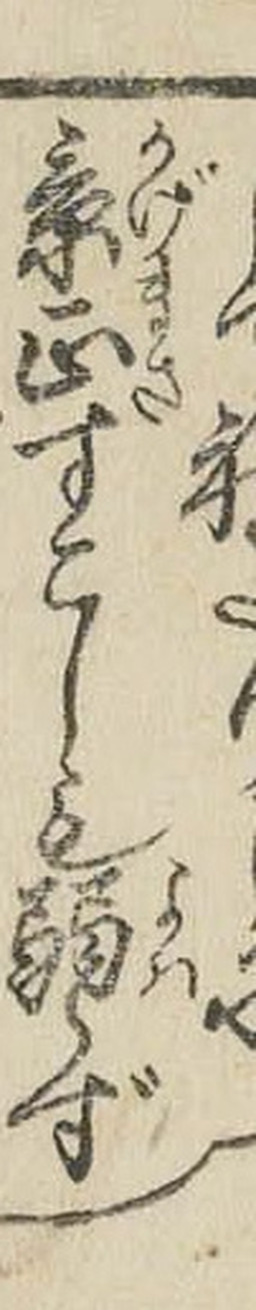景正すこしも弱らず
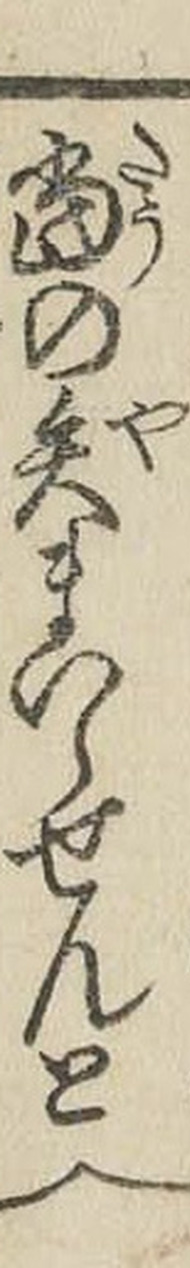当の矢まいらせんと
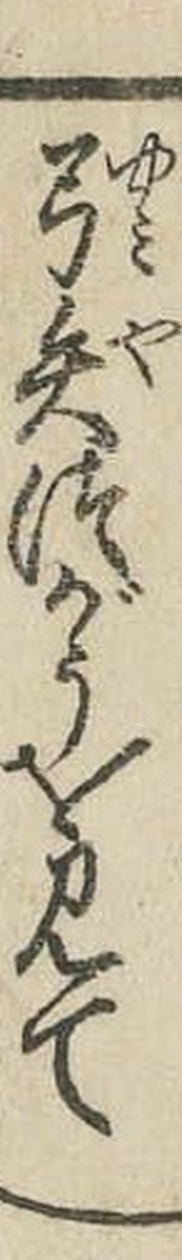弓矢つがうを見て
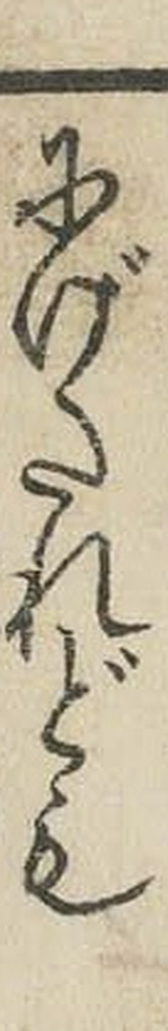にげたれども
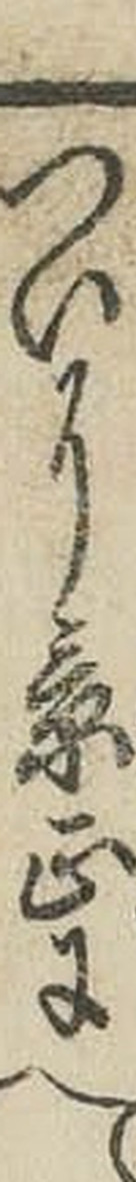ついに景正に
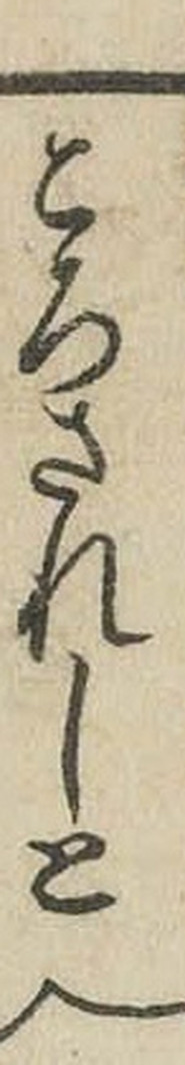ころされしと

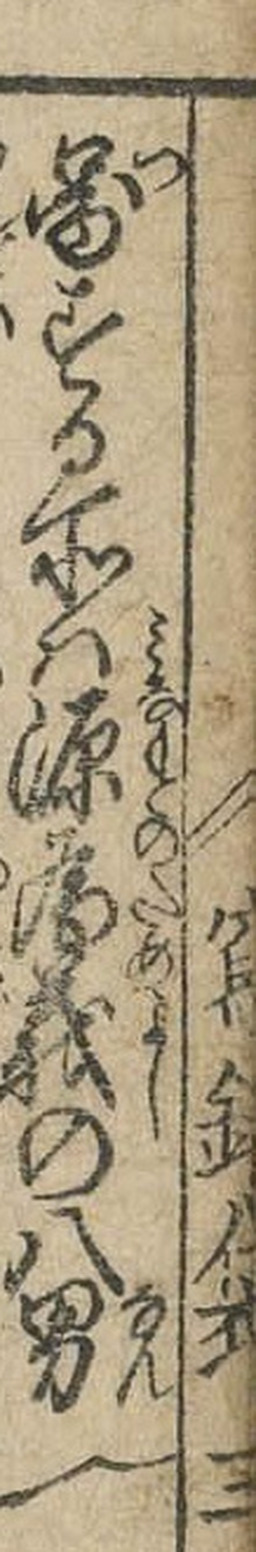図する所は源為義の八男
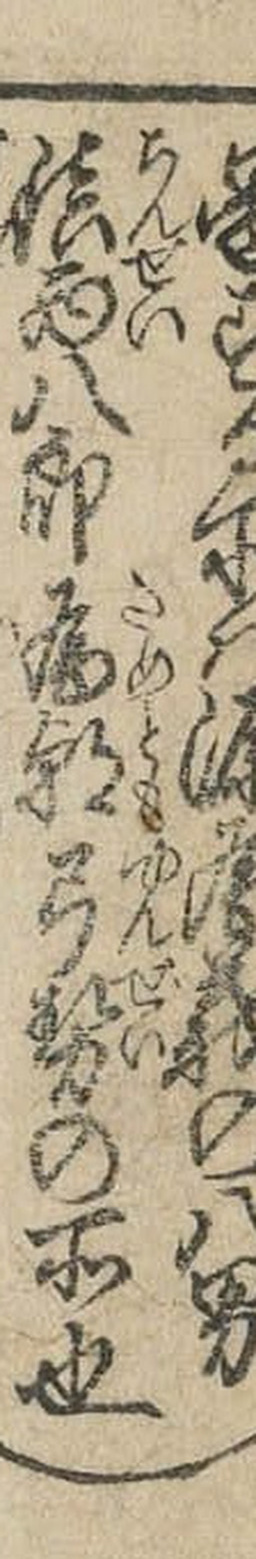鎮西八郎為朝弓勢の所也
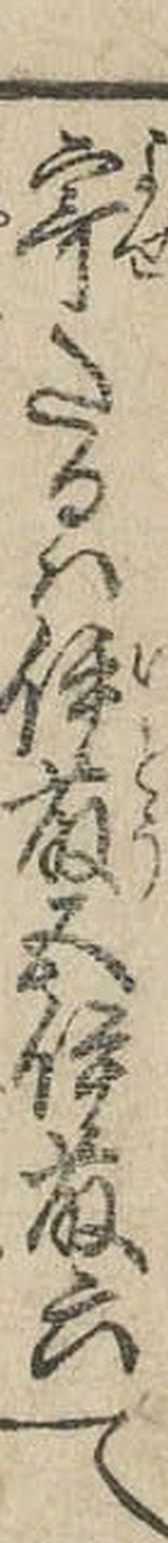寄たるは伊藤五伊藤六
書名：絵本写宝袋 9巻 3之巻
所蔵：東京学芸大学教育コンテンツアーカイブ
